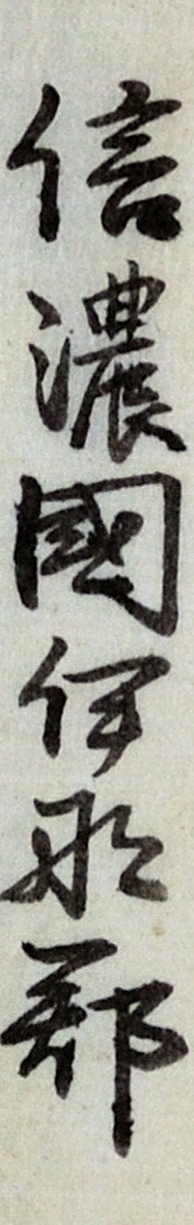信濃国伊那郡
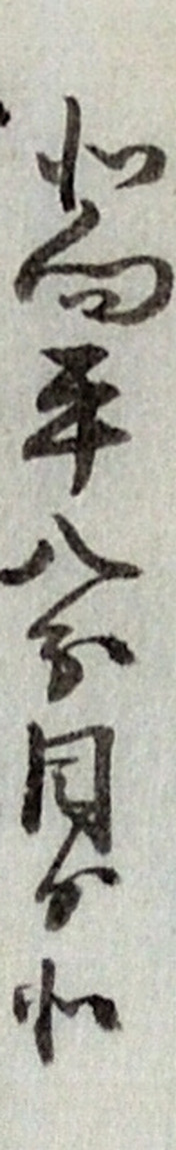北向平八分目ゟ北
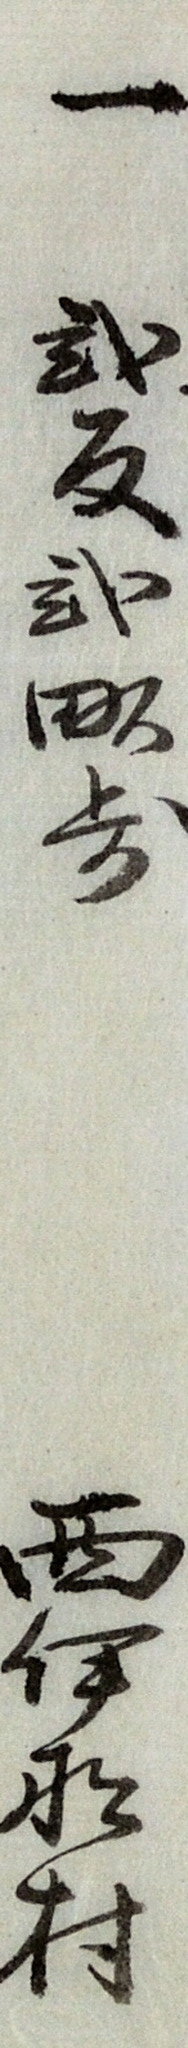一弐反弐㽗歩西伊那村
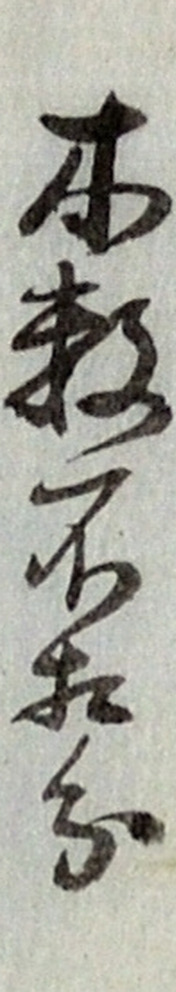木数不相分
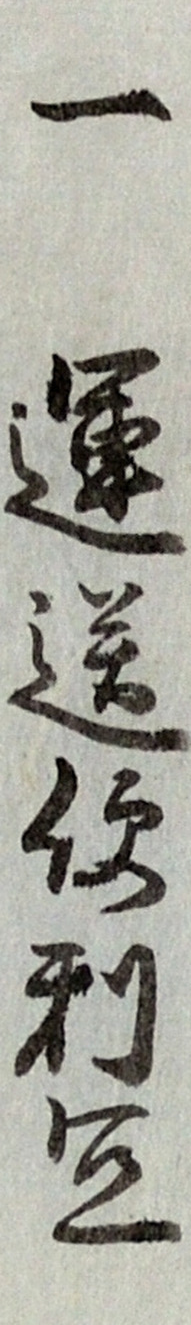一運送便利宜
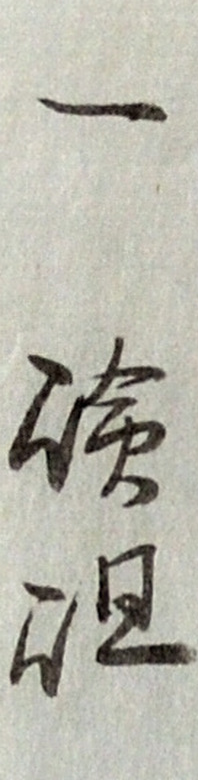一嶮岨

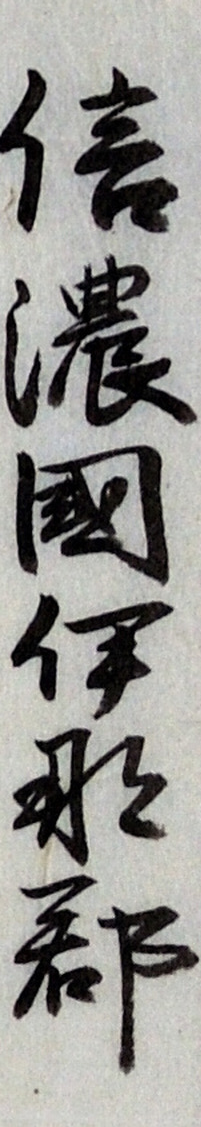信濃国伊那郡
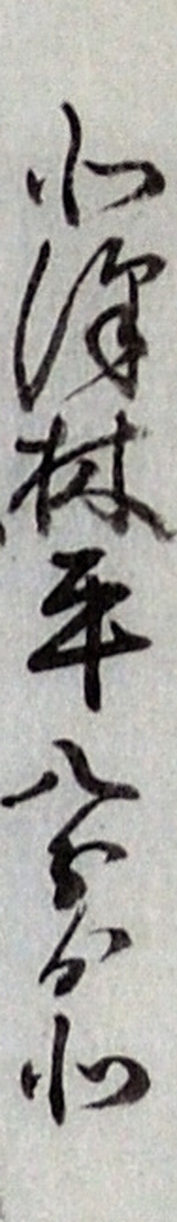北澤林平八分ゟ北
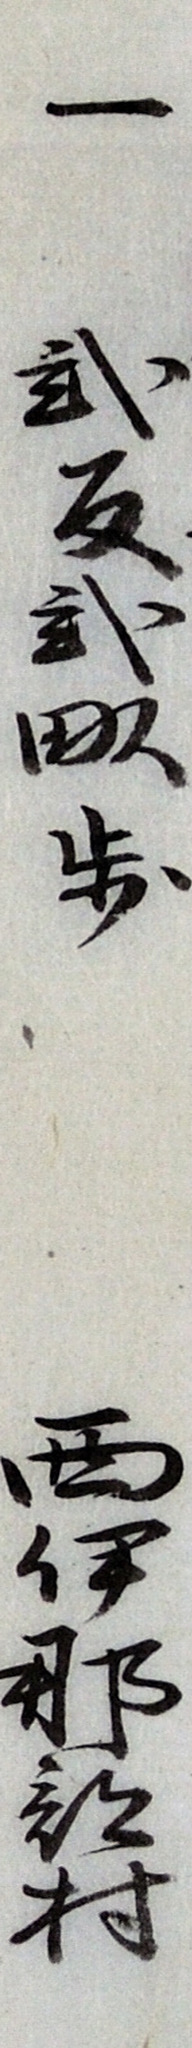一弐反弐㽗歩西伊那部村
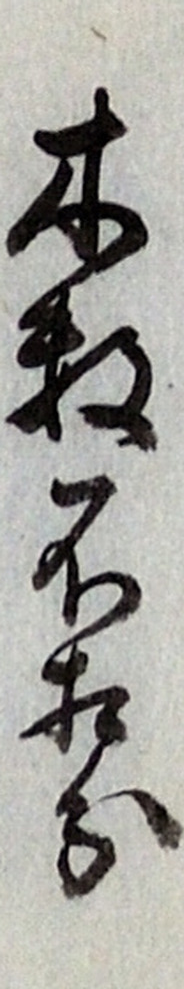木数不相分
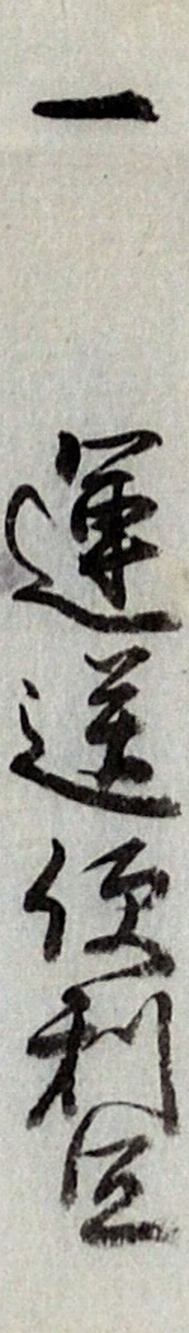一運送便利宜
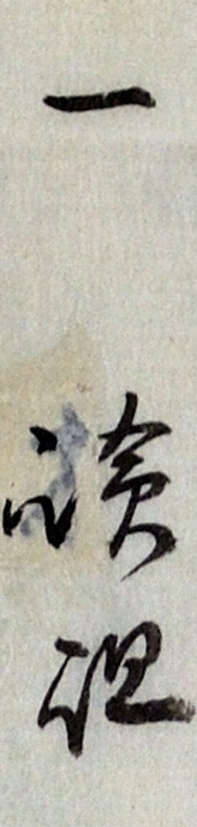一嶮岨
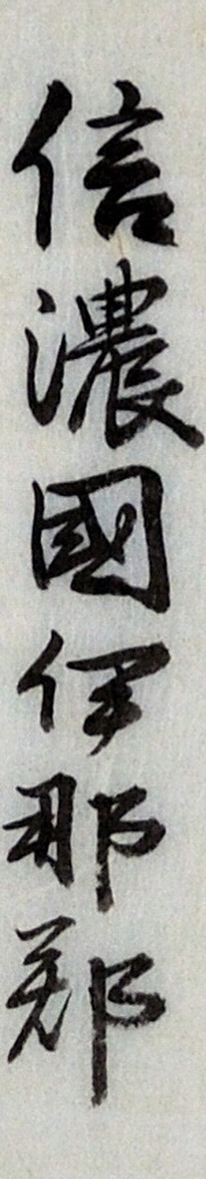信濃国伊那郡
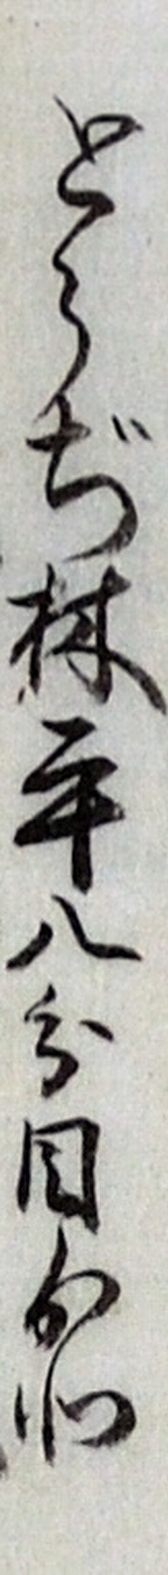とうぢ林平八分目ゟ北
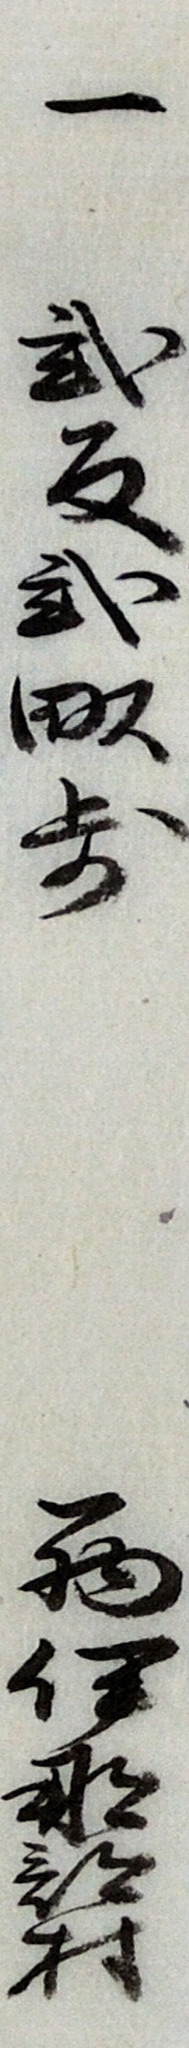一弐反弐㽗歩西伊那部村
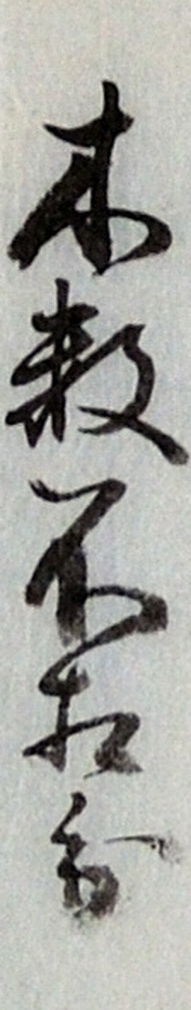木数不相分
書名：官林反別帳
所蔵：伊那市立高遠町図書館・合同会社AMANE
